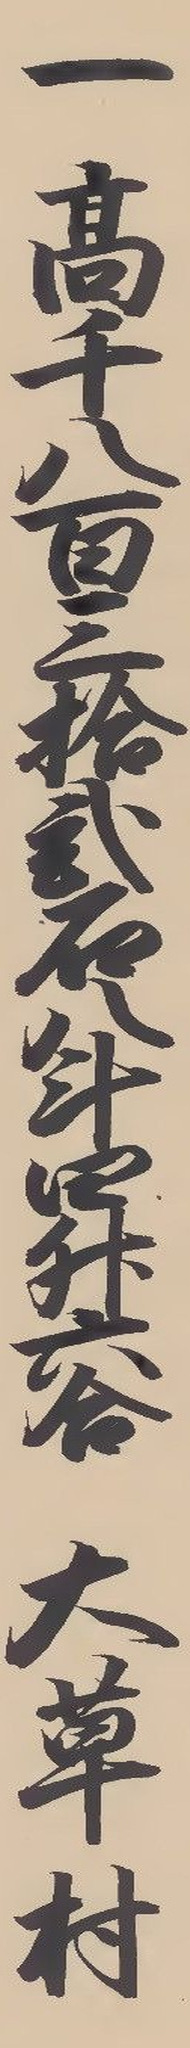一高千八百三拾弐石八斗四升六合大草村
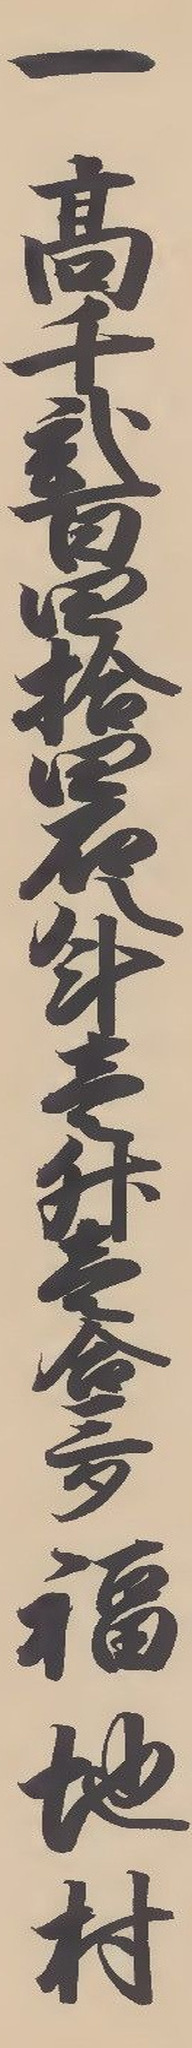一高千弐百四拾四石八斗壱升壱合三勺福地村
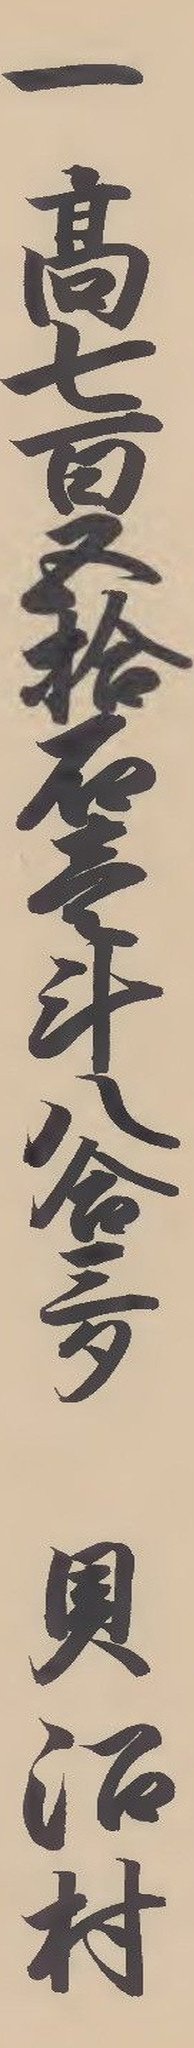一高七百五拾石壱斗八合三勺貝沼村
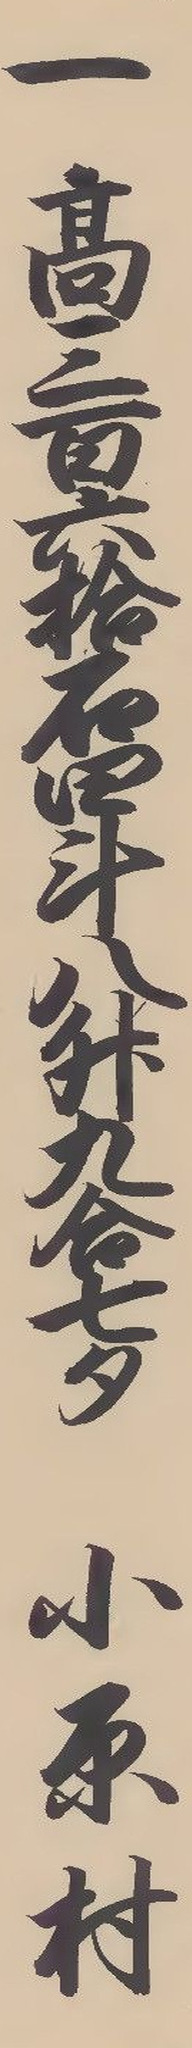一高三百六拾石四斗八升九合七勺小原村
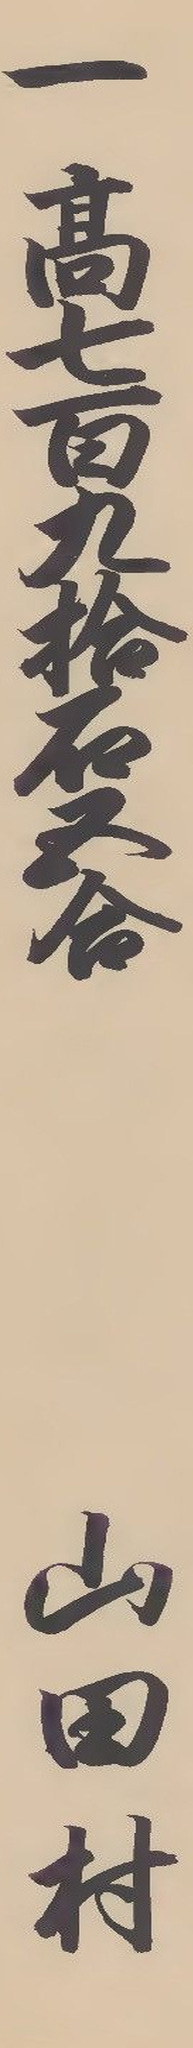一高七百九拾石五合山田村

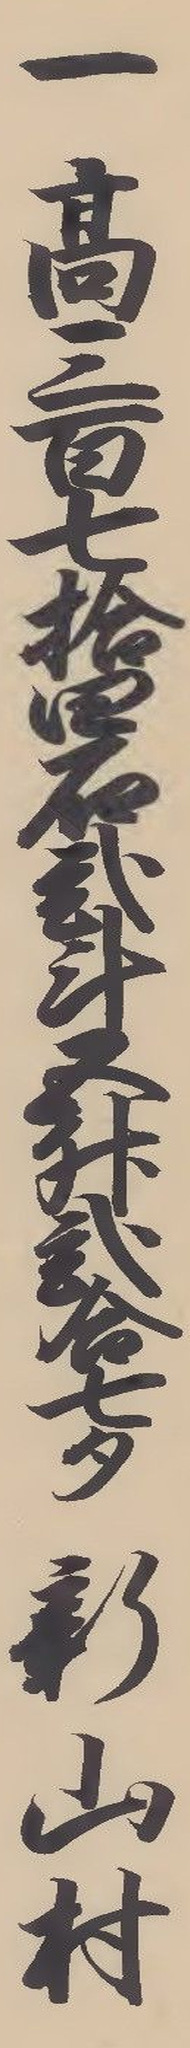一高三百七拾四石弐斗五升弐合七勺新山村
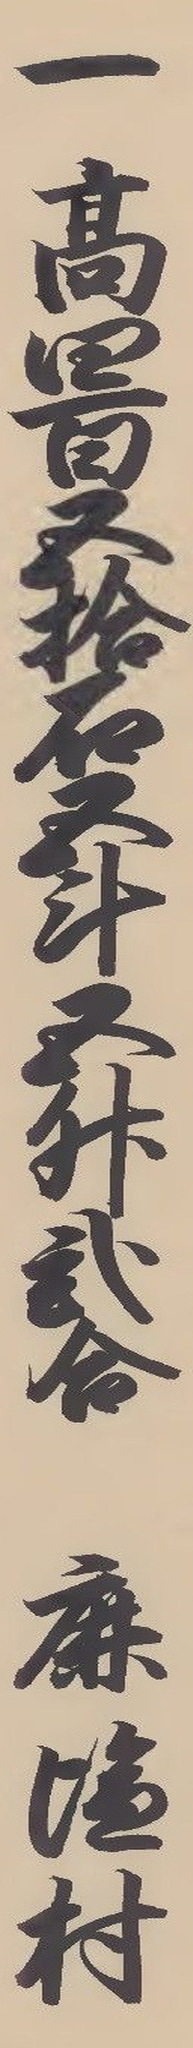一高四百五拾石五斗五升弐合鹿塩村
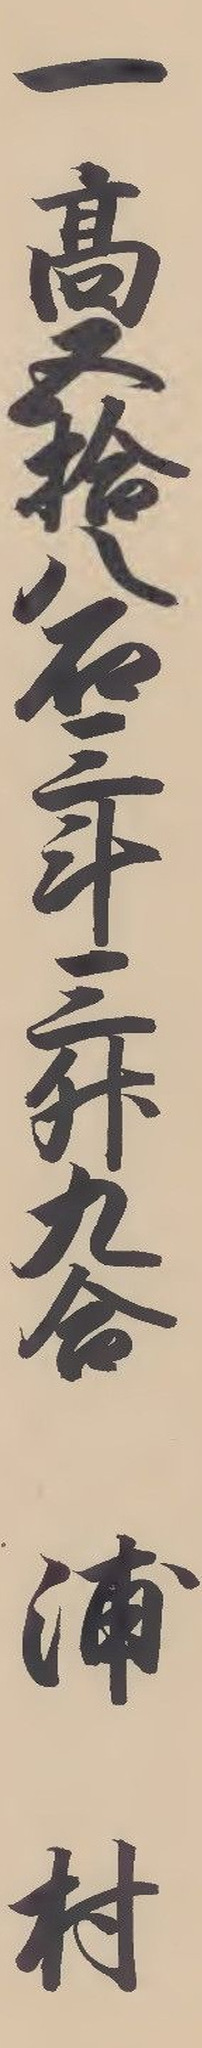一高五拾八石三斗三升九合浦村
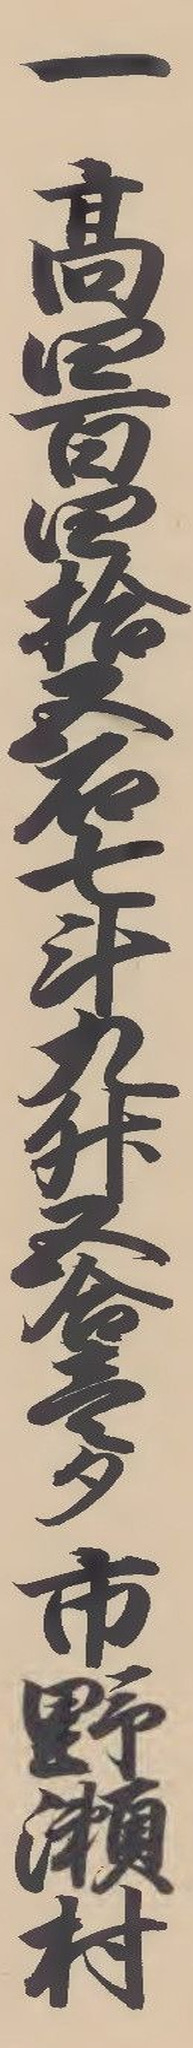一高四百四拾五石七斗九升五合壱勺市野瀬村
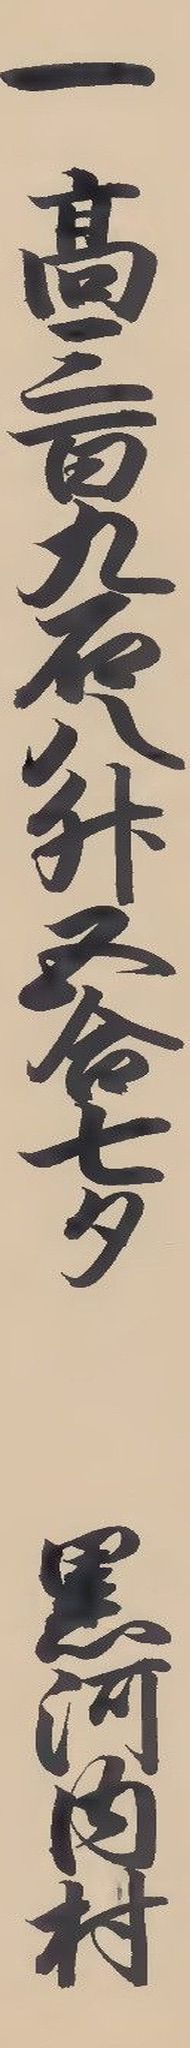一高三百九石八升五合七勺黒河内村
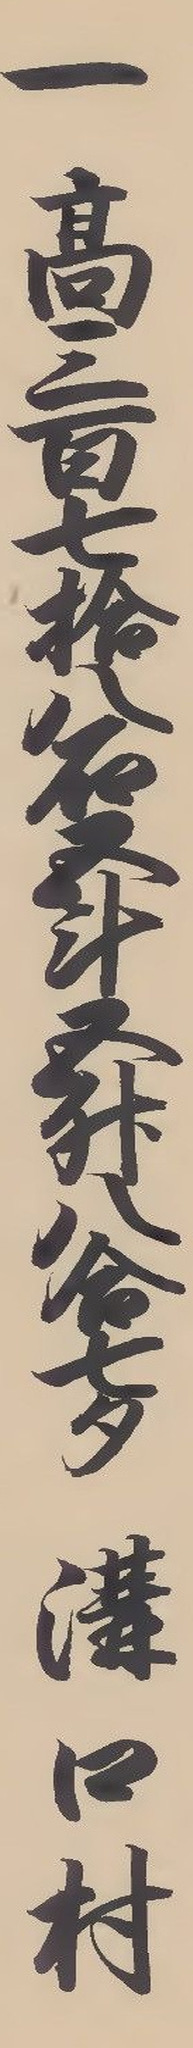一高三百七拾八石五斗五升八合七勺溝口村
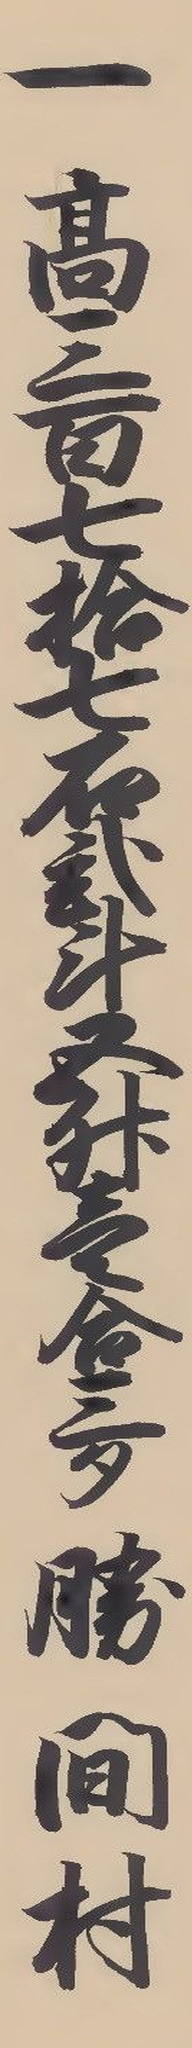一高三百七拾七石弐斗五升壱合三勺勝間村
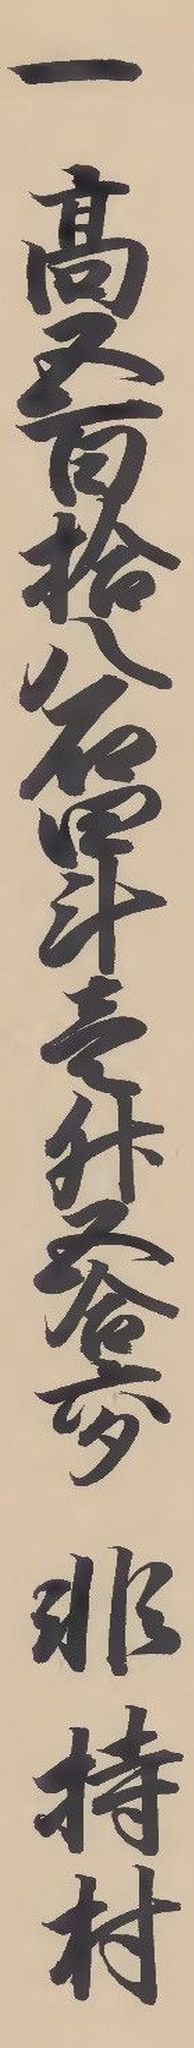一高五百拾八石四斗壱升五合六勺非持村

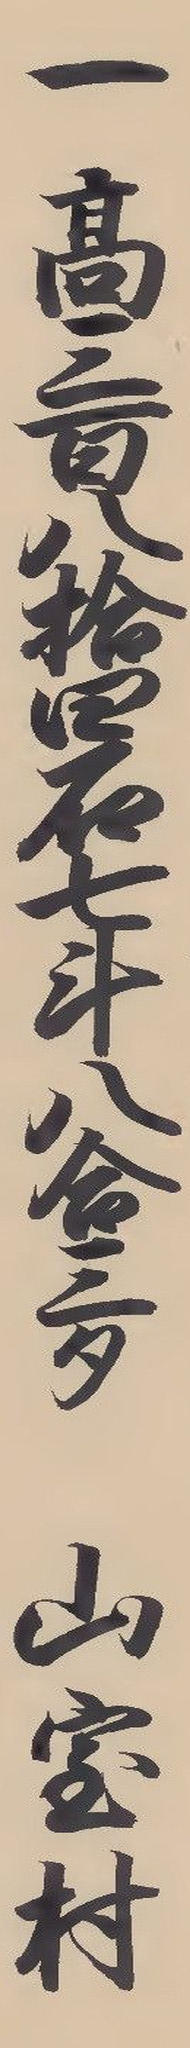一高三百八拾四石七斗八合三勺山室村
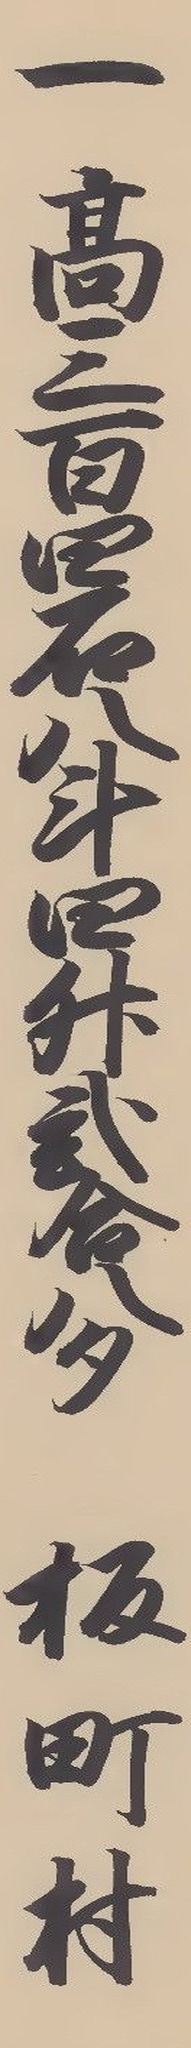一高三百四石八斗四升弐合八勺板町村
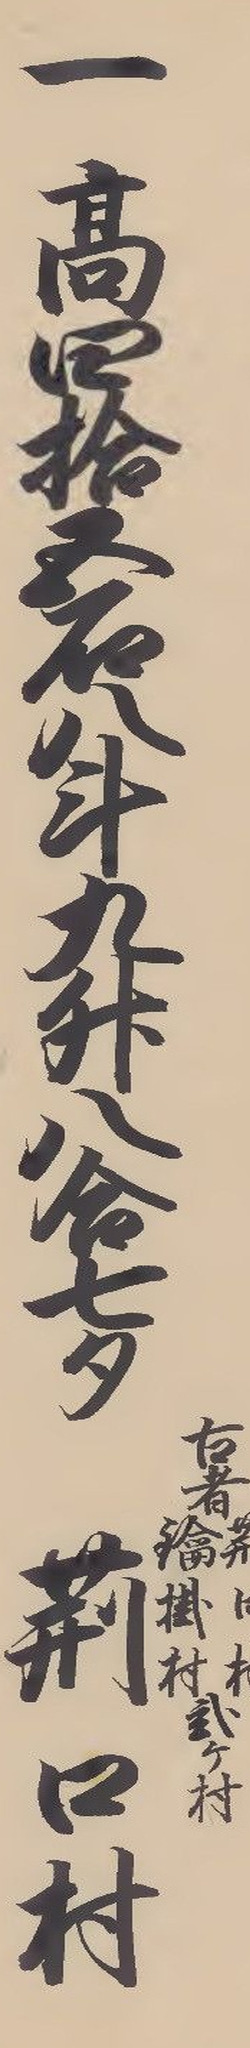一高四拾五石八斗九升八合七勺荊口村
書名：信濃国郷帳
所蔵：国立公文書館 National Archives of Japan
